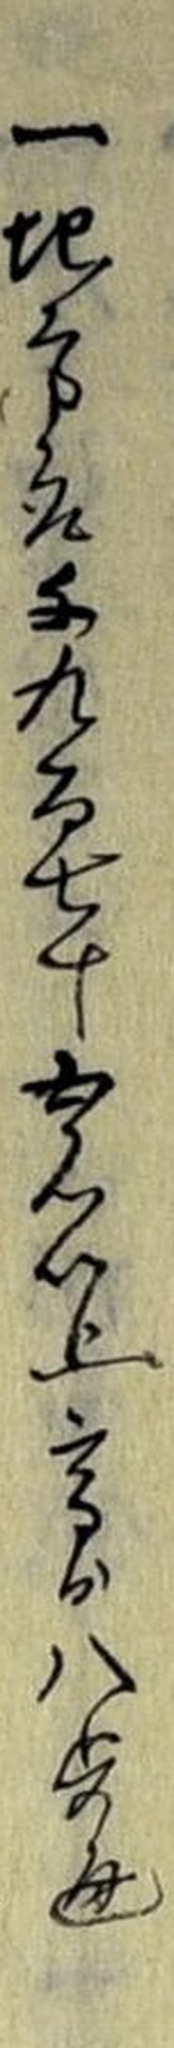一地方取千九百七十五石以上高ゟ八歩通
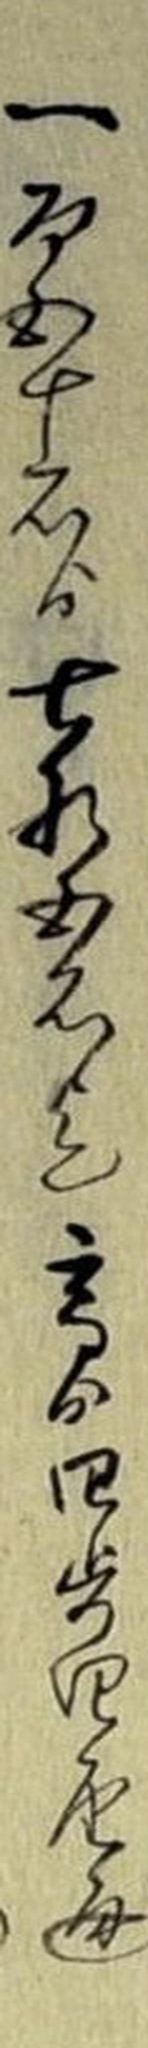一百五十石ゟ七拾五石迄高ゟ四歩四厘通
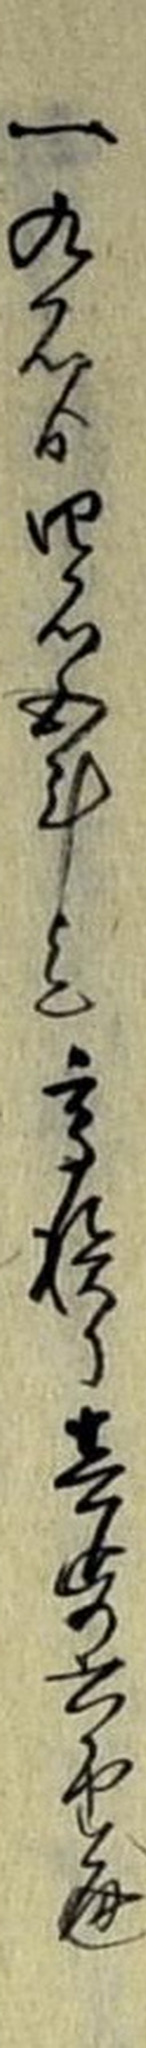一九石ゟ四石五斗迄高積り壱歩六厘通
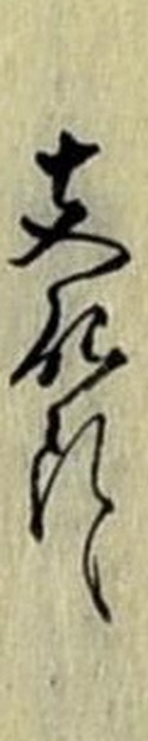支配頭へ
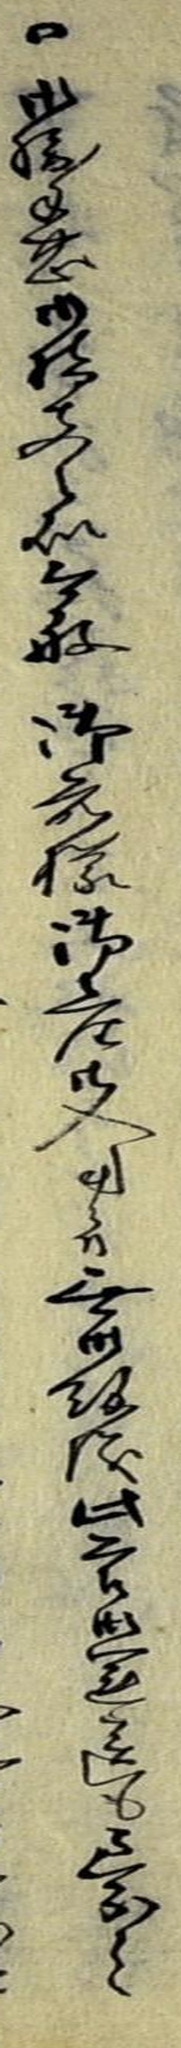〇御勝手甚御指支之処今般御前様御産御入用に付無御余儀此節御運送も過分之
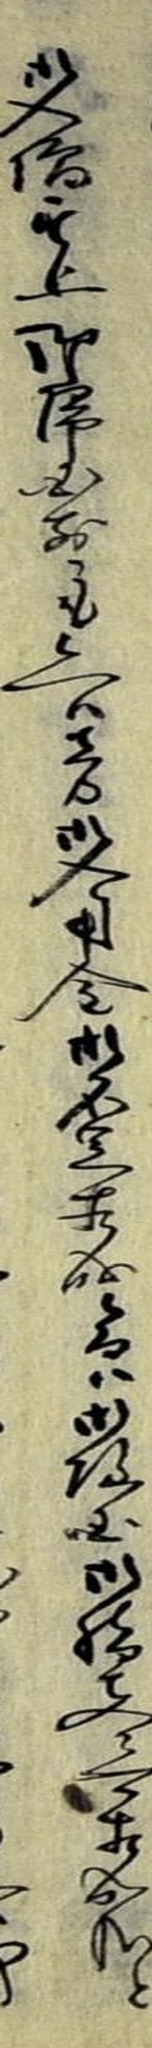御入増其上御帰国前にも候へは旁御入用金御不足相成候而は御帰国御指支に可相成哉と
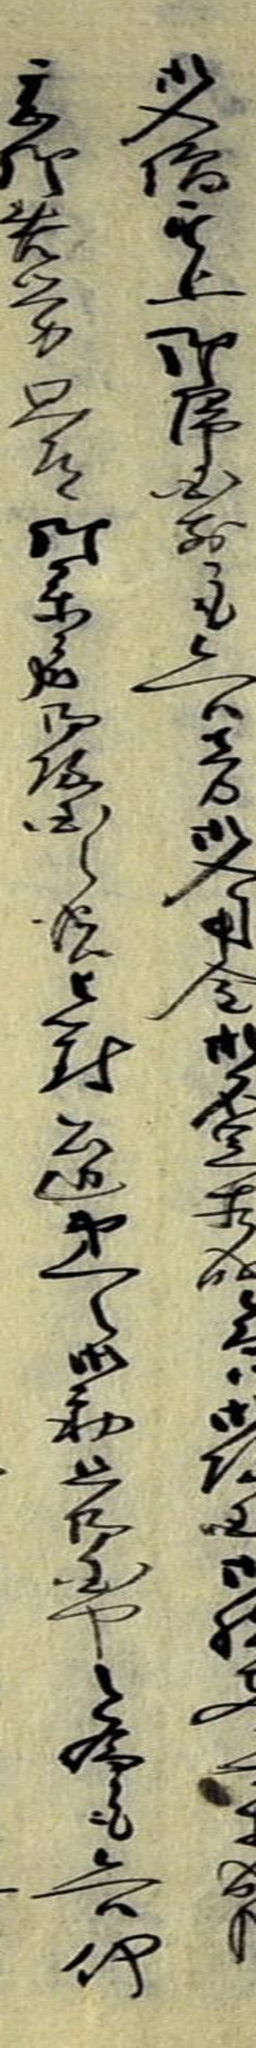甚御苦労思召候御参府御帰国之儀は被対公辺第一之御勤且御国中之為にも候へは何
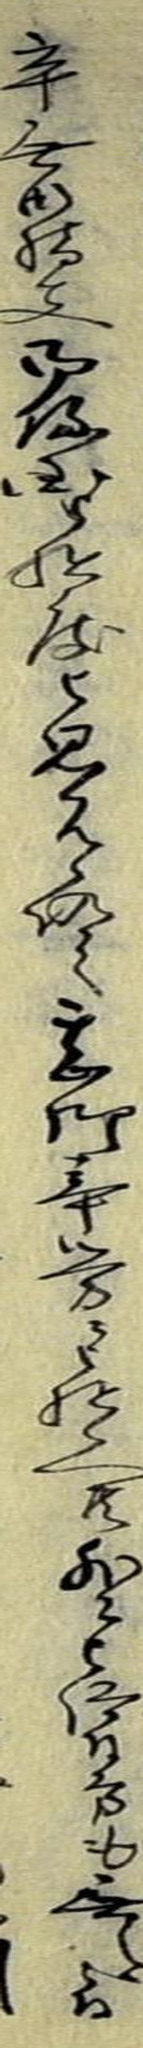卒無御指支御帰国被遊度被思召候仍之甚御辛労に被遊候へ共外に被仰付方も無之候に付
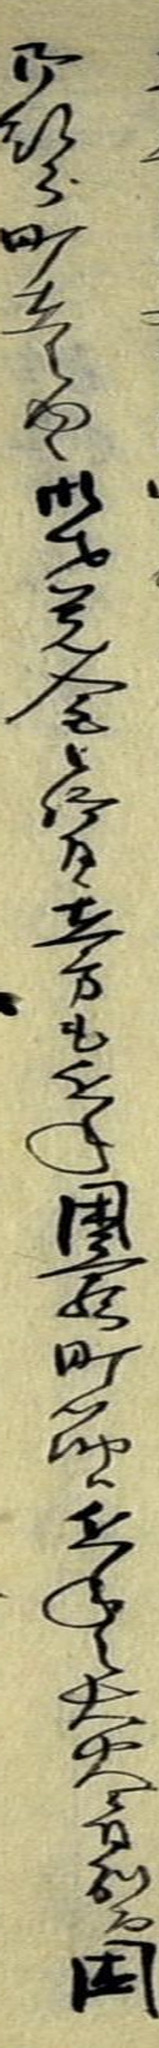御領分町在之内へ御才覚金被仰付候在方も近年困窮町筋は近年之大火に付別而困
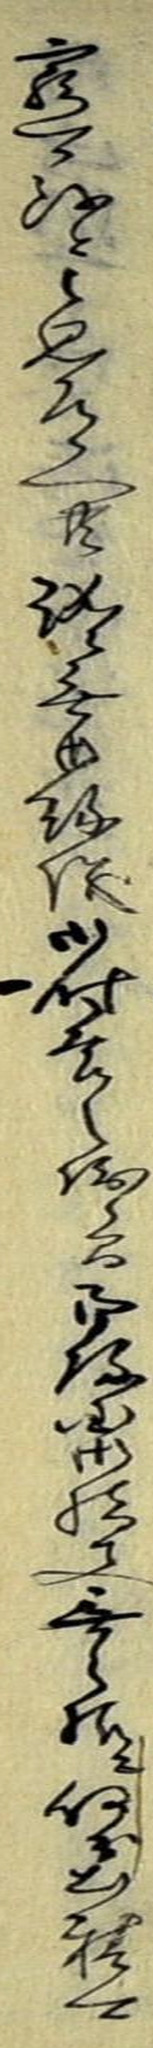窮可致と被思召候へ共誠に無御余儀御時節之儀候間御帰国御指支無之様に何分出精可

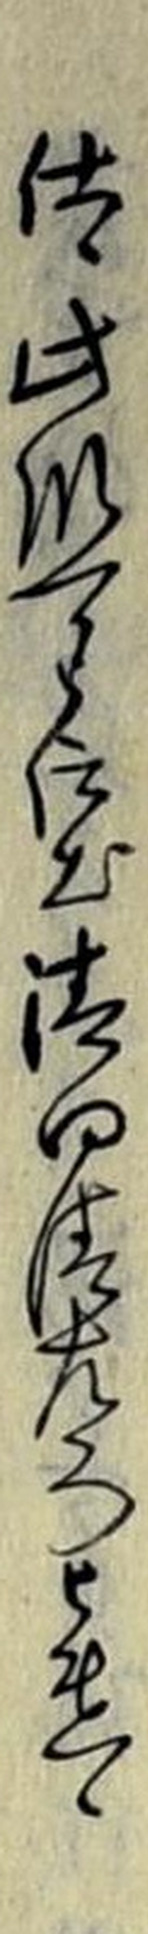仕候此段可被仰出清田清左衛門被遣候
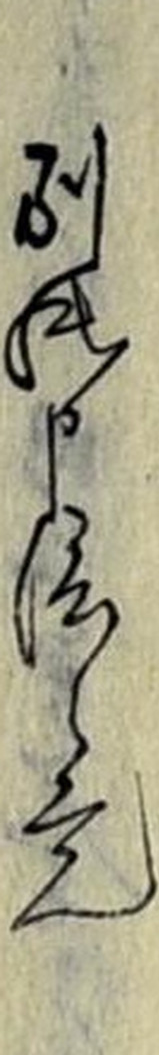別紙申渡之覚
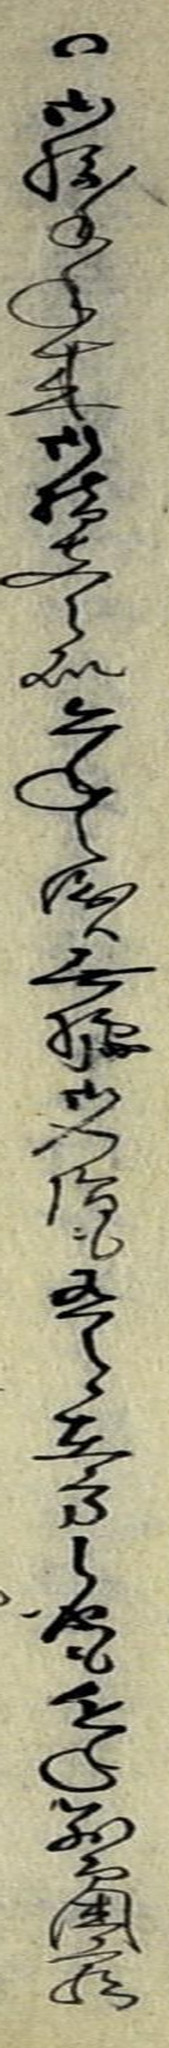〇御勝手年来御指支之処今年之儀は無拠御入増も有之在方之儀も近年別而困窮
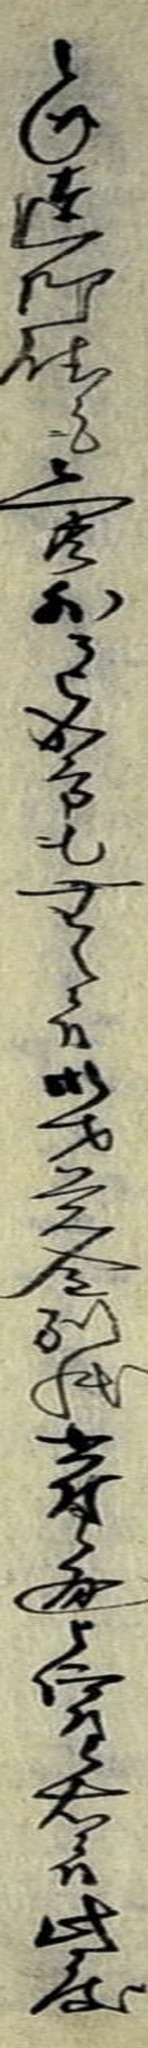之趣達御聴にも候へ共外に被成方も無之に付御才覚金別紙書付之通被仰付候右に付此度
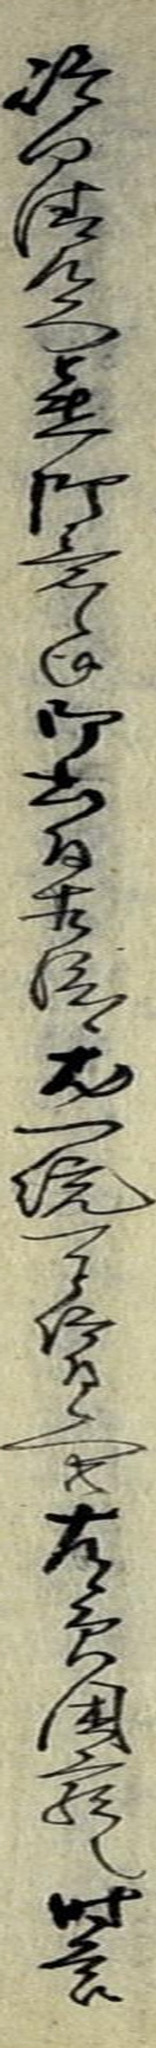嶋田清左衛門被遣御意之趣御書付相渡候尤一統可被仰付候へ共左候而は困窮之時節
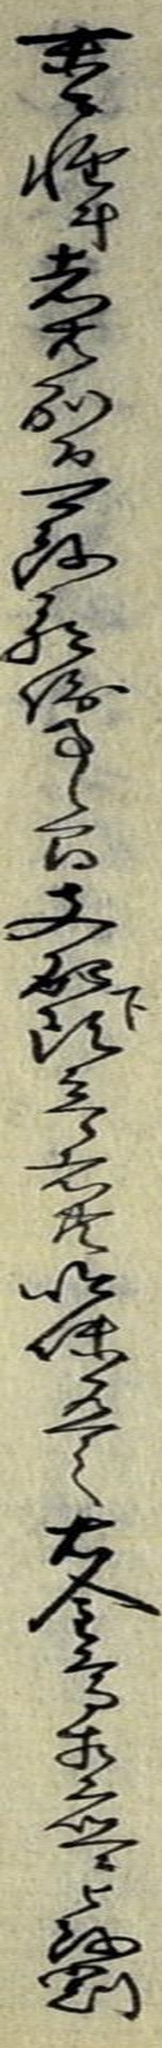末々軽き者共別而可致難儀事候間支配下頭立之者共吟味有之右金高相応に被致割
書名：命令之部 二
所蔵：福井県文書館 Fukui Prefectural Archives
